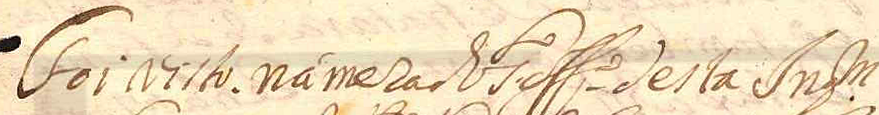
Foi visto. na meza do s.t off.o desta Inq.m
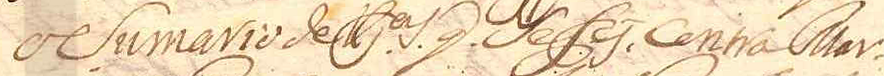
o Sumario de tt.as. q̄. se fes. contra Mar
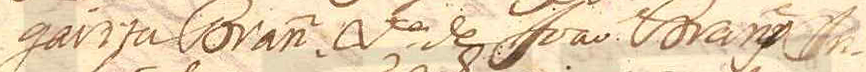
garita Bran̄ v.a de Joaõ Bran̄s In
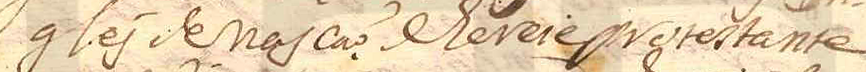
glés de nasçaõ e hereie protestante
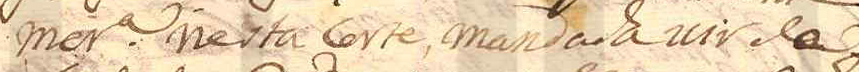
mor.a nesta corte, mandada uir da
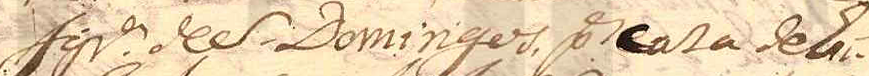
Igr.a de S. Domingos, p̄ caza de hū
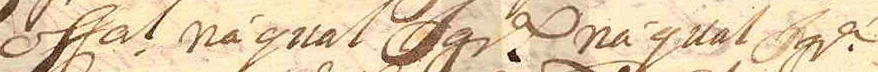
offal. na qual Jgr.a na qual Igr.a
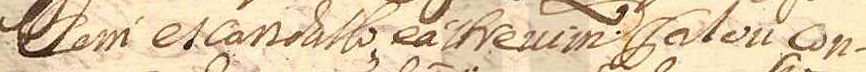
Com escandallo, e attreuimto. falou con
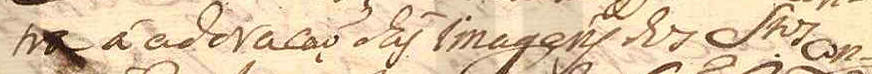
tra á adoraçaõ das Imagen̄s dos S.tos con
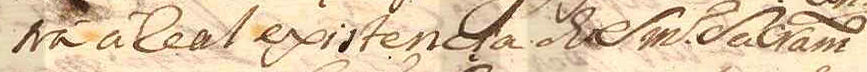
tra a Real existencia do Sm.o Sacramto
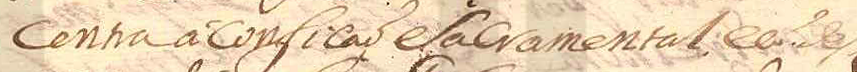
contra á confiçaõ Sacramental e á des
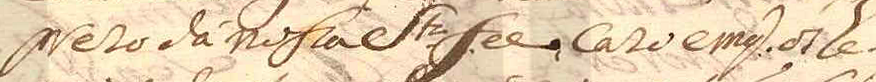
prezo da nossa S.ta fee, cazo em q̄ os he
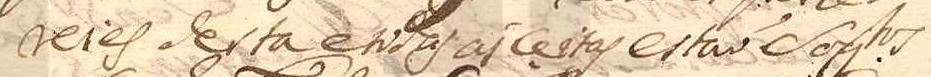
reies desta e todas as ceitas estaõ sog.tos
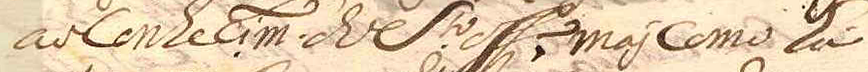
ao conhecim.to do S.to off.o mas como há
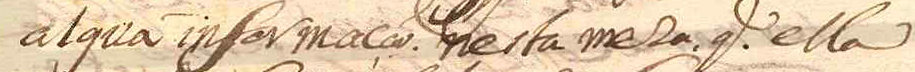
alguā informaçaõ nesta meza, q̄ ella
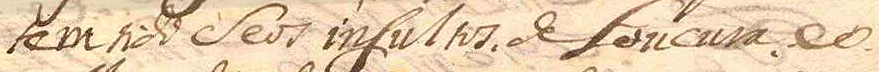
tem tido seos insultos de Loucura e o
